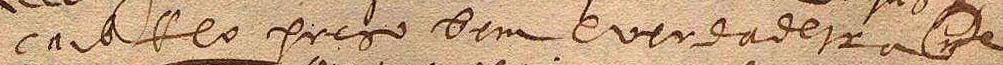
ça do Reo preso bem e verdadejramēte
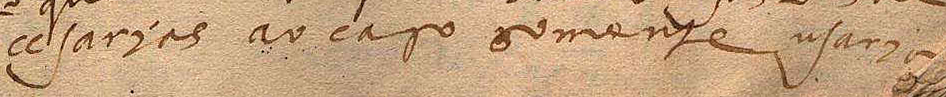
cesarias ao caso somente usarja
